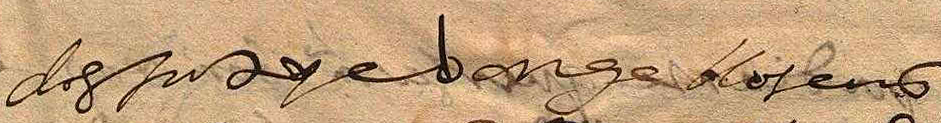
dos santos evangelhos em q̄
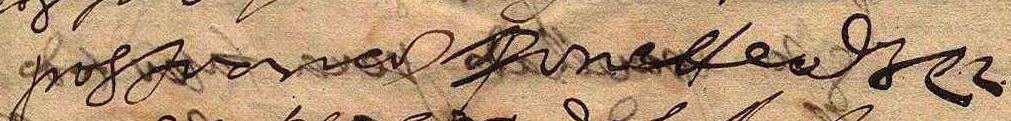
pos sua maõ ꝓmetteo dizer
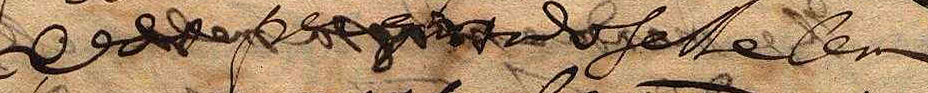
ꝟdade perguntado se lhe lem
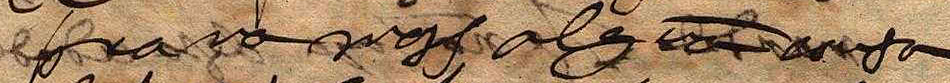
braua majs algūa cousa
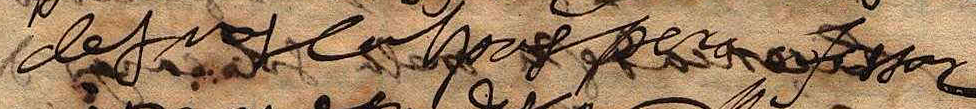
de suas culpas pera cōfessar
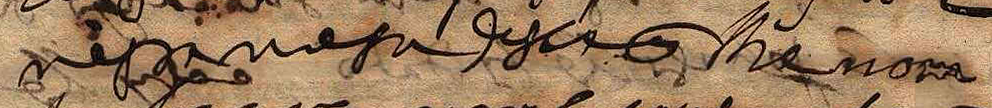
nesta mesa disse q̄ lhe nom
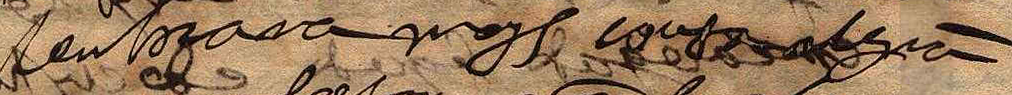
lembraua majs cousa alguā
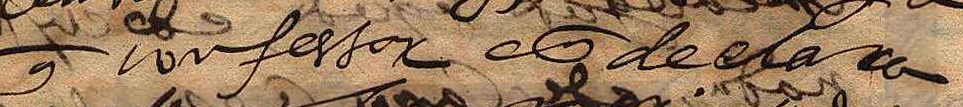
q̄ confessar e q̄ declara
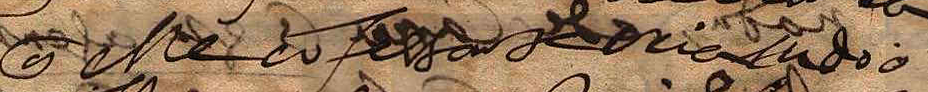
q̄ elle cōfessase cria tudo o
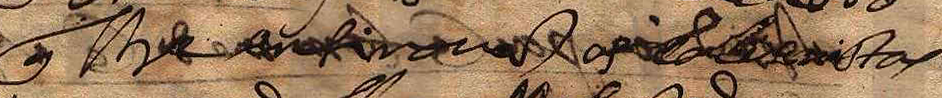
q̄ lhe ensinauaõ os caluenistas
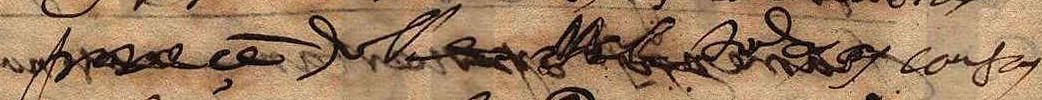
parecēdo lhe Mal todas as cousas
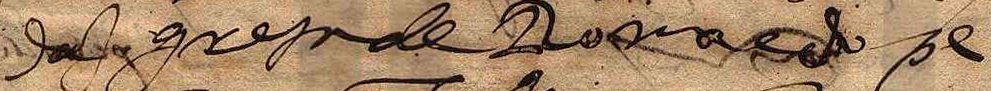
da Jgreja de Roma e do pe
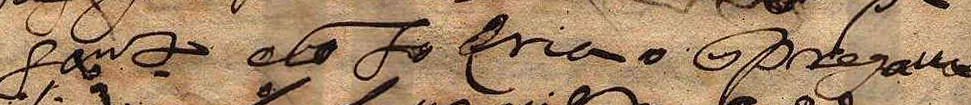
santo e q̄ so Cria o q̄ pregaua
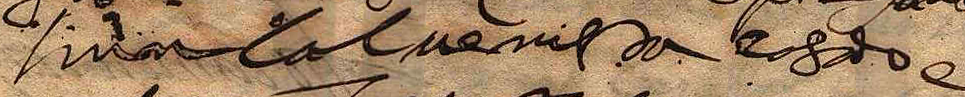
hum Caluenista casado e
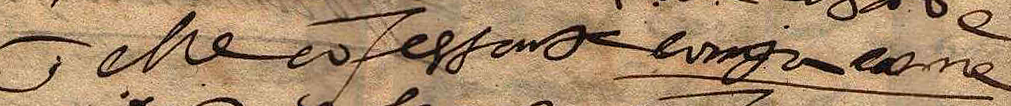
q̄ elle cōfessante comja carne
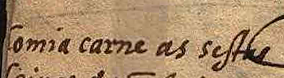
Comia carne as sestas
